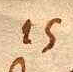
15
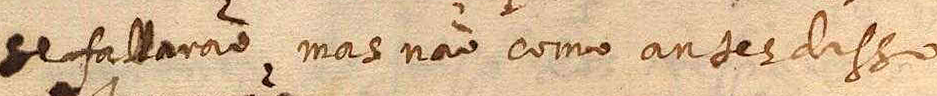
se fallarão mas não como antes disso
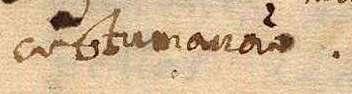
costumauaõ.
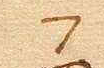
7
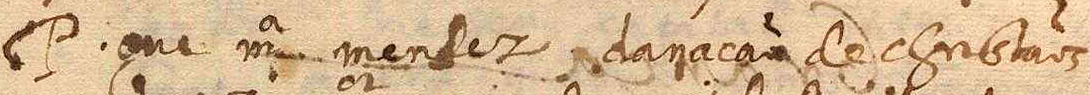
P. que ma mendez da naçaõ de christaõs
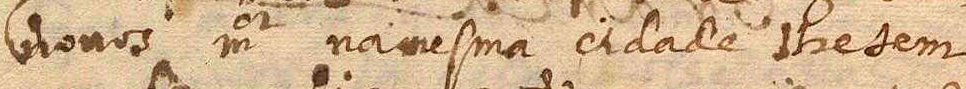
nouos mor na mesma cidade lhe tem
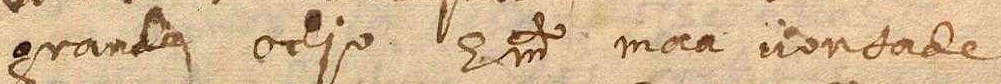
grande odjo E mto maa uontade
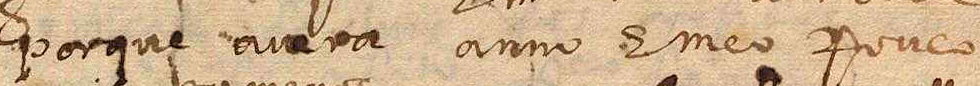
porque auera anno E meo pouco
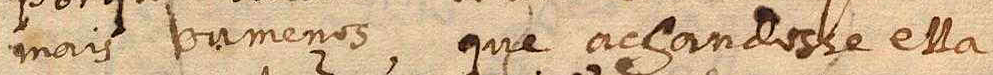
mais ou menos que achandosse ella
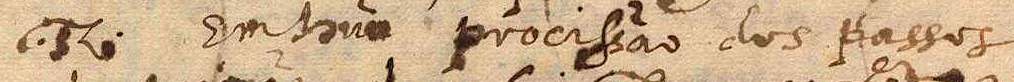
R. Em huā procissão dos passos
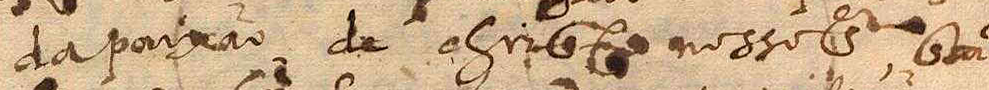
da paixão de christo nosso sor estā
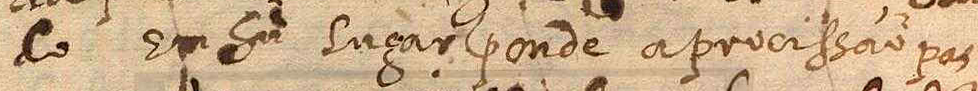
do Em hū Lugar p̄ onde a procissaõ pas
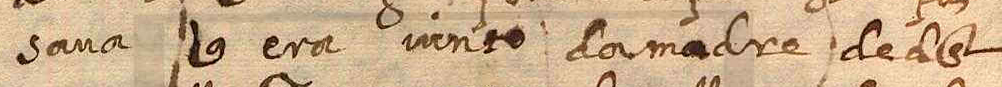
saua q̄ era iunto da madre de ds̄
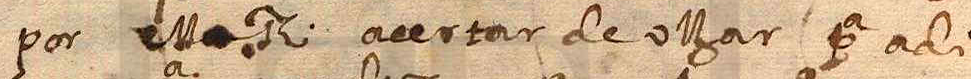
por ella .R. acertar de olhar pa a di
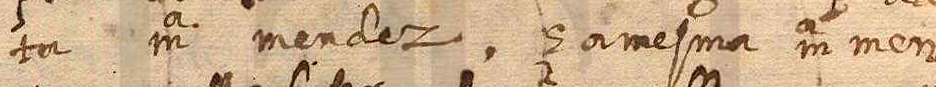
ta ma mendez, E a mesma ma men
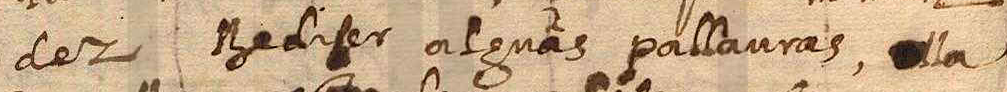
dez lhe diser alguās pallauras, _lla
